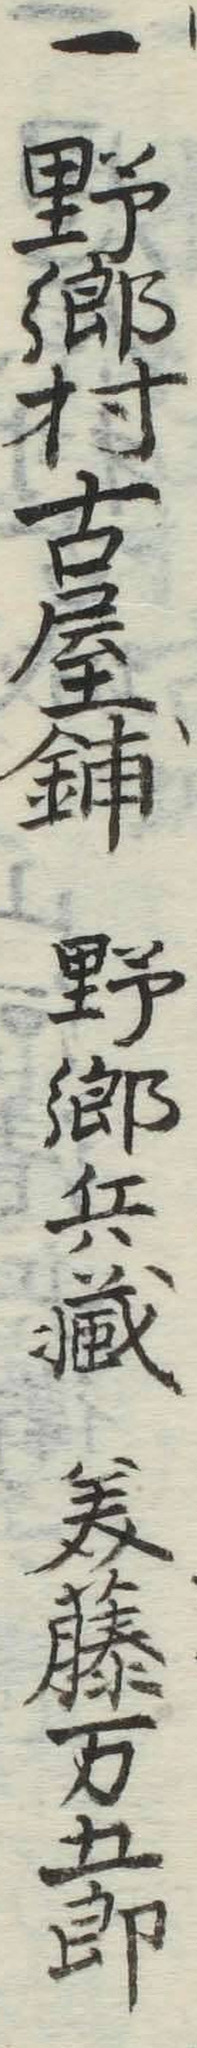一野郷村古屋鋪野郷兵蔵美藤万五郎
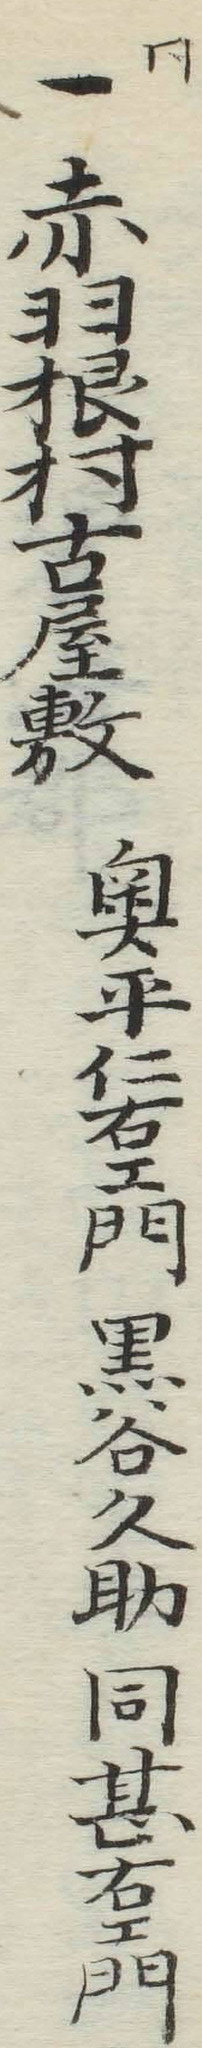一赤羽根村古屋鋪奥平仁右エ門黒谷久助同甚右エ門
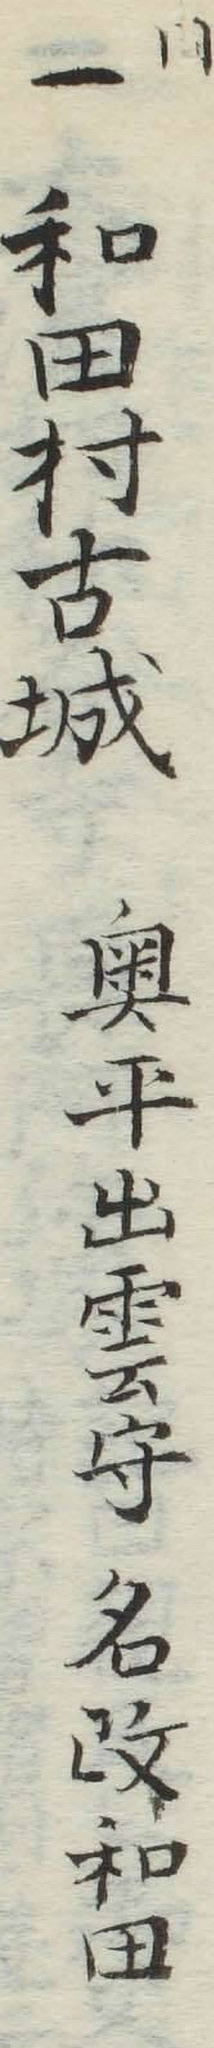一和田村古城奥平出雲守名改和田
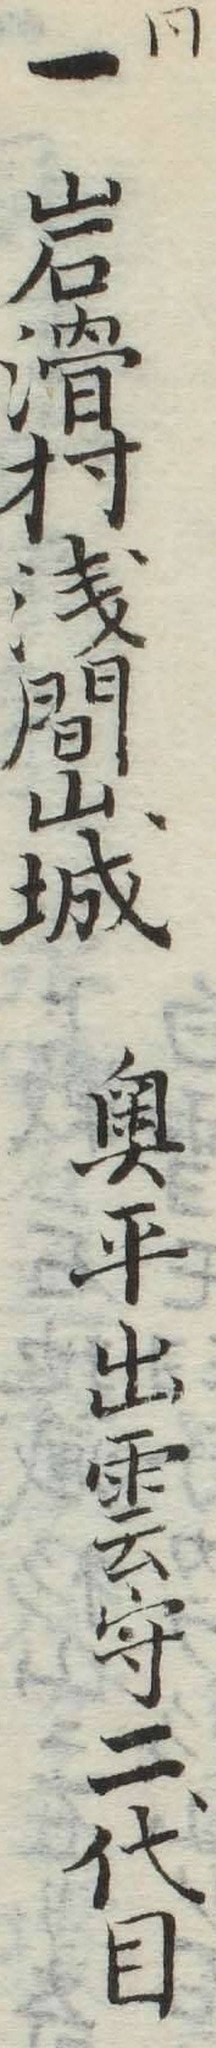一岩滑村浅間山城奥平出雲守二代目
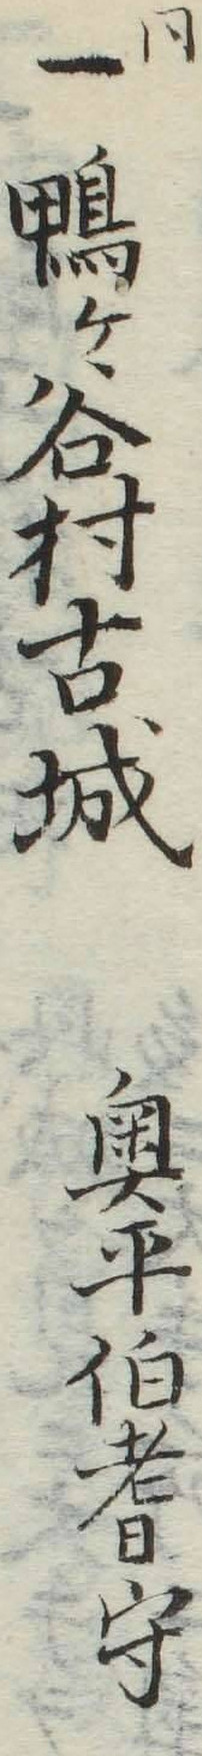一鴨ヶ谷村古城奥平伯耆守
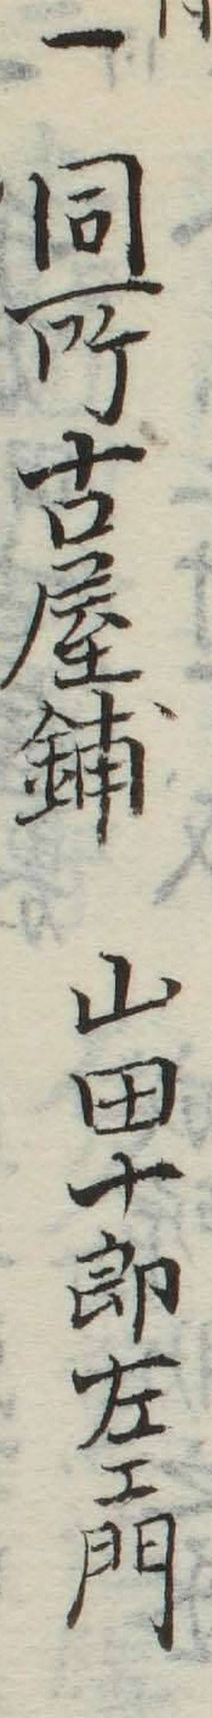一同所古屋鋪山田十郎左エ門
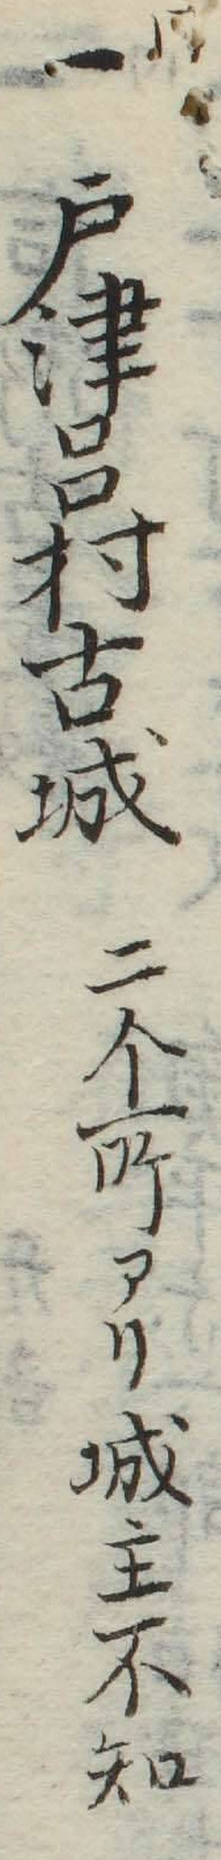一戸津呂古城二箇所アリ城主不知

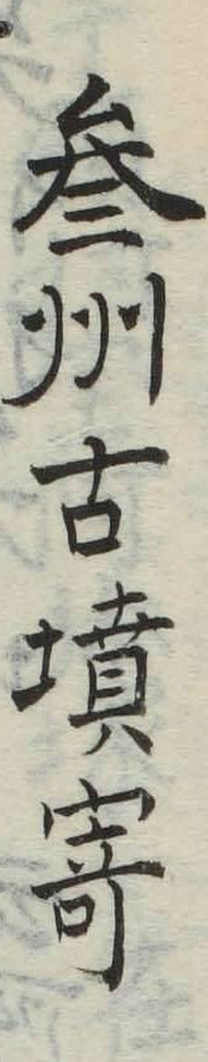参州古墳寄
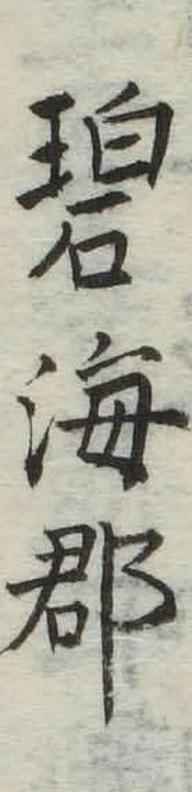碧海郡
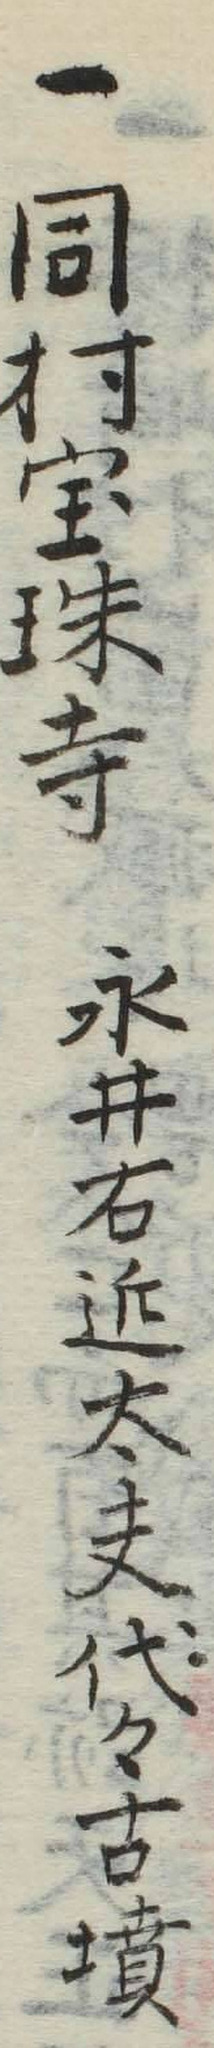一同村宝珠寺永井右近太夫代々古墳
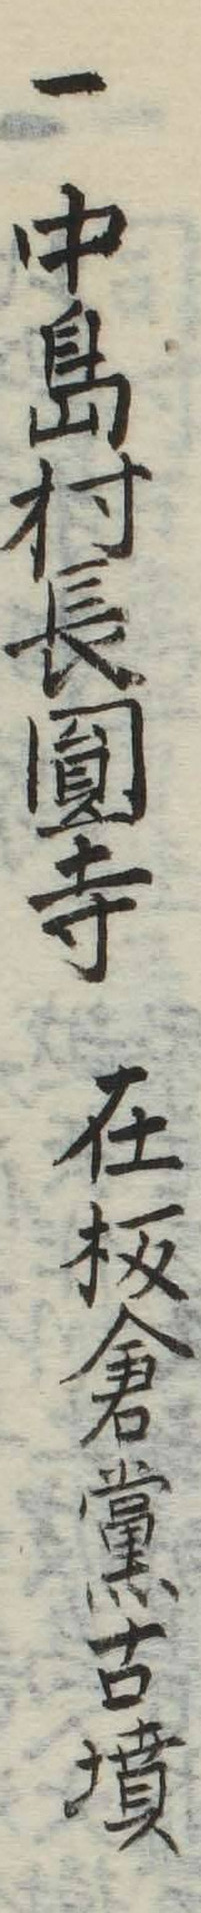一中島村長円寺在板倉党古墳
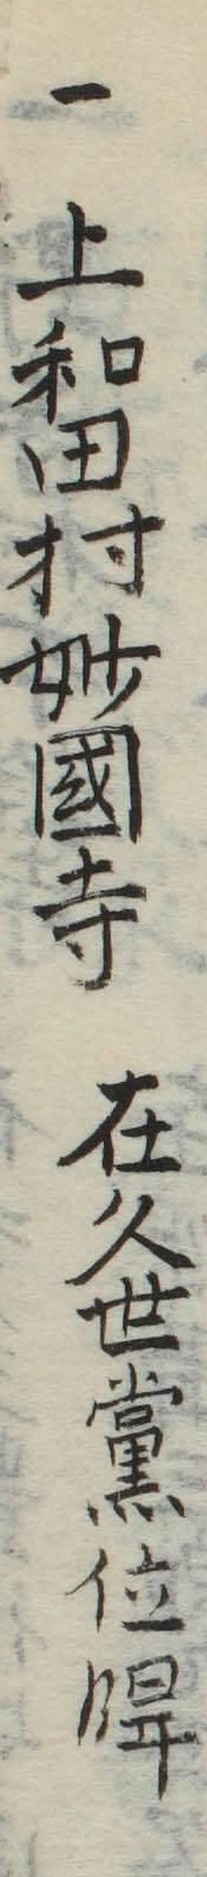一上和田村妙国寺在久世党位牌
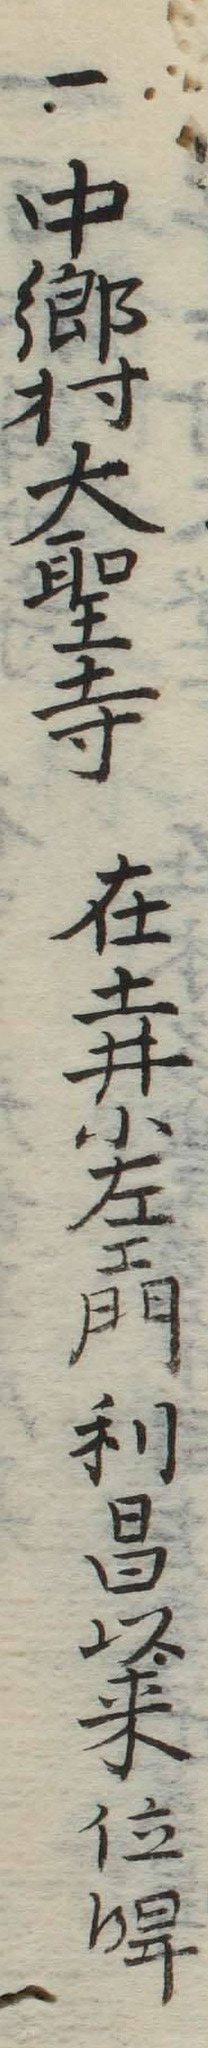一中郷村大聖寺在土井小左エ門利昌以来位牌

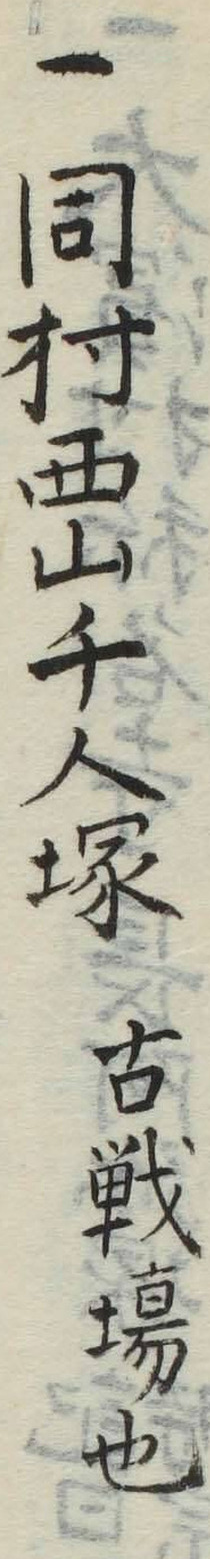一同村西山千人塚古戦場也
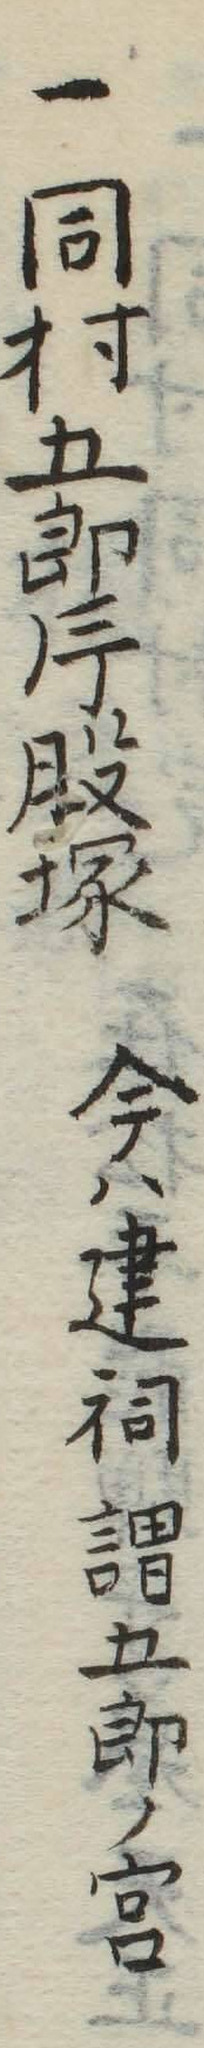一同村五郎片股塚今ハ建祠謂五郎ノ宮
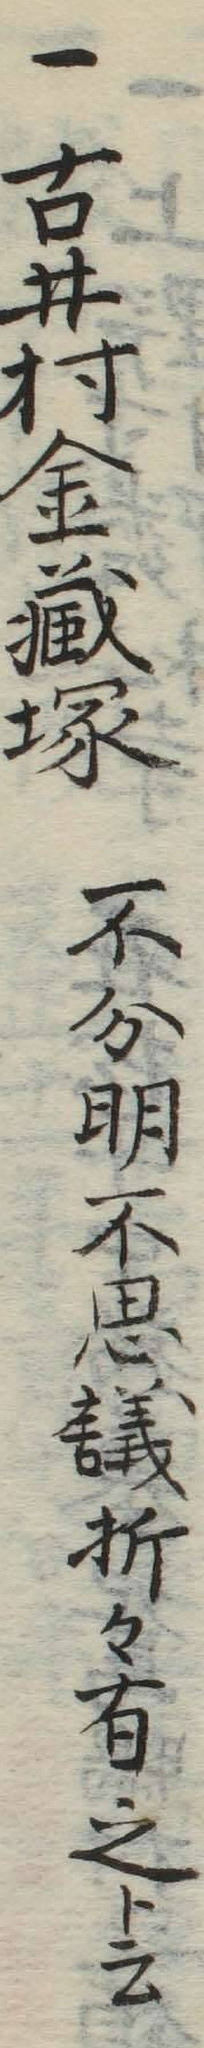一古井村金蔵塚不分明不思議折々有之ト云
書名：三河国二葉松
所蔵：国文学研究資料館
